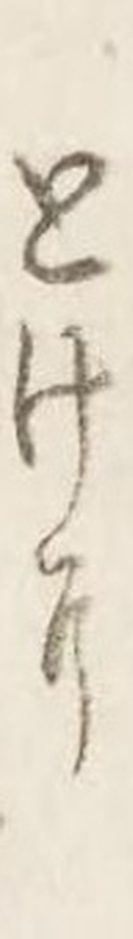とけに

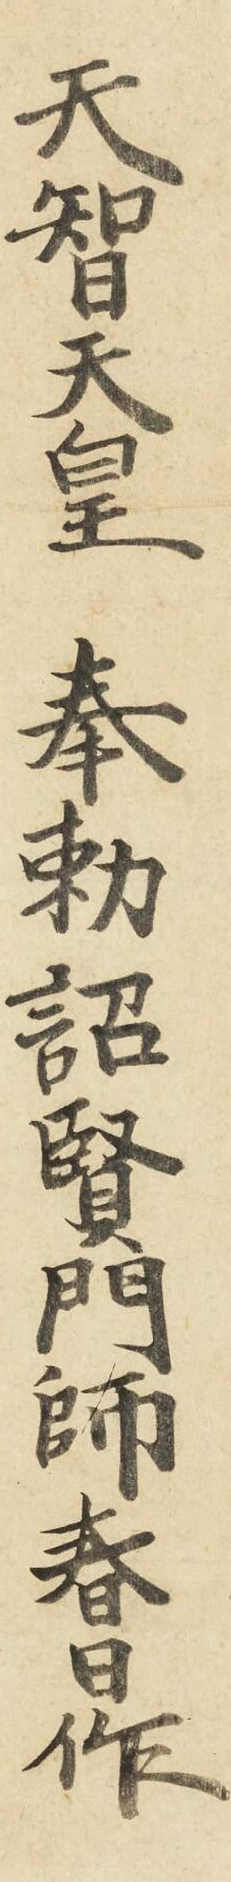天智天皇奉勅詔賢門師春日作
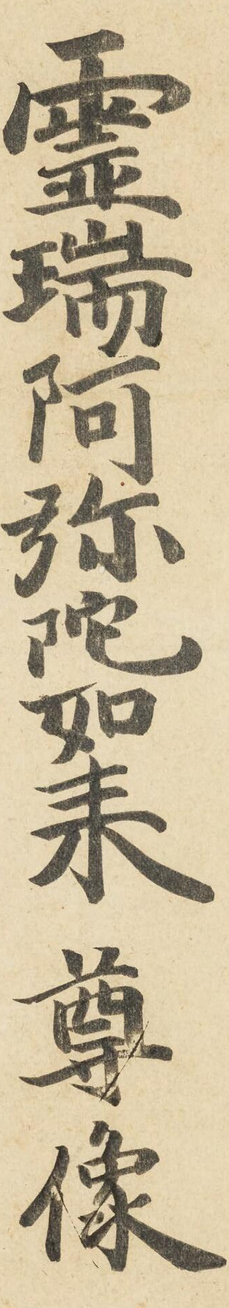霊瑞阿弥陀如来尊像
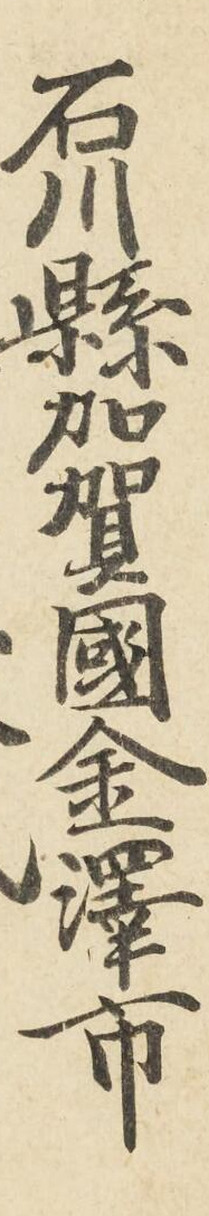石川懸加賀國金澤市
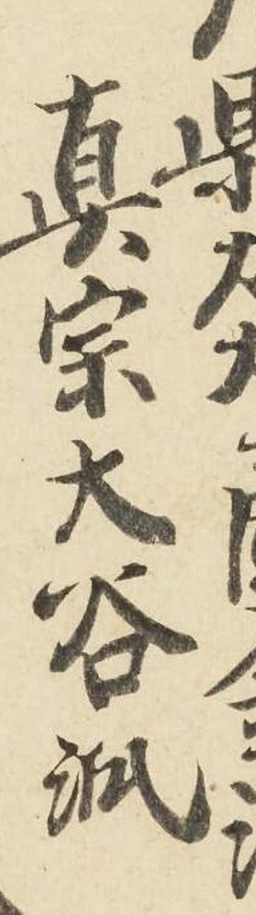真宗大谷派
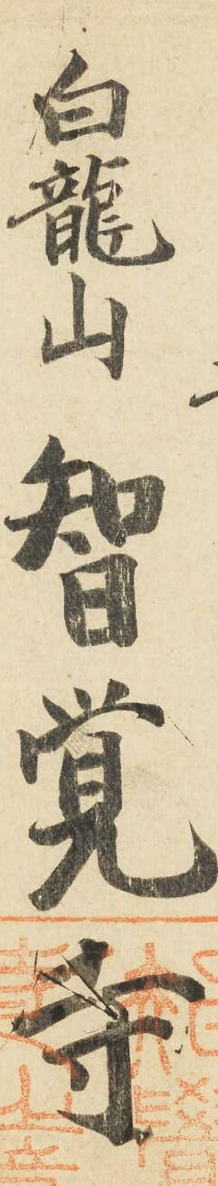白龍山智覚寺

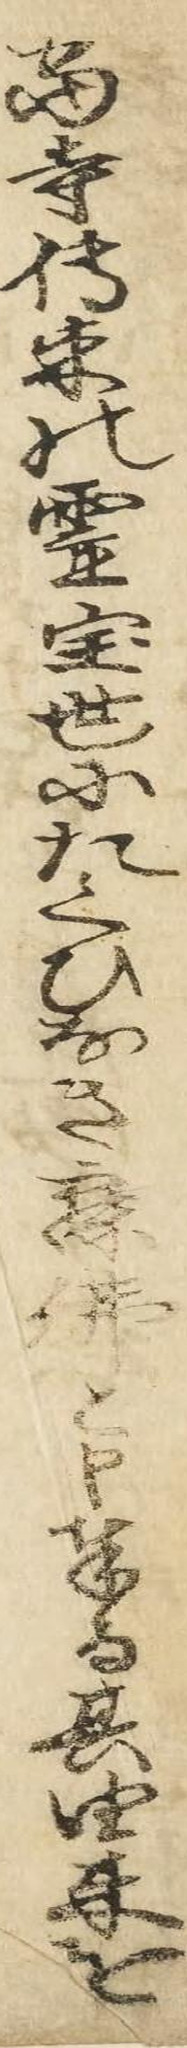当寺伝来の霊宝世にたくひなき寝仏と申奉る其由来を
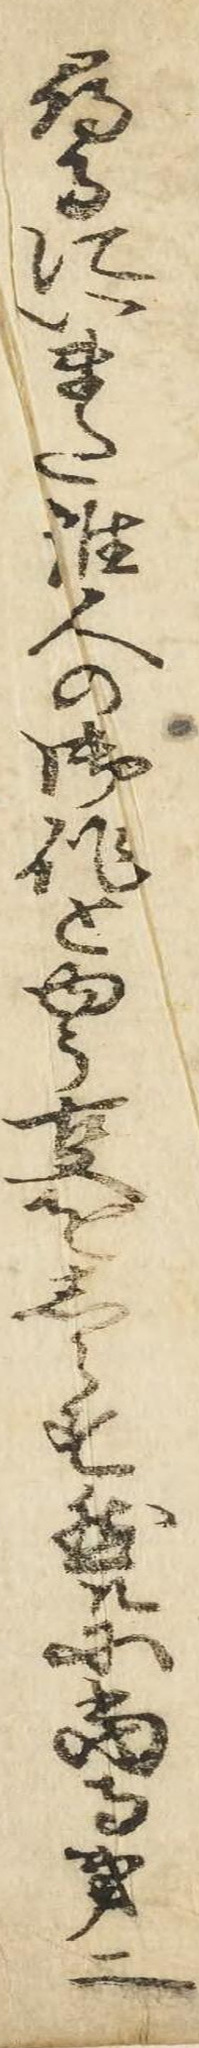尋るにいまた誰人の御作とゆう事をしらす然るに当寺第二
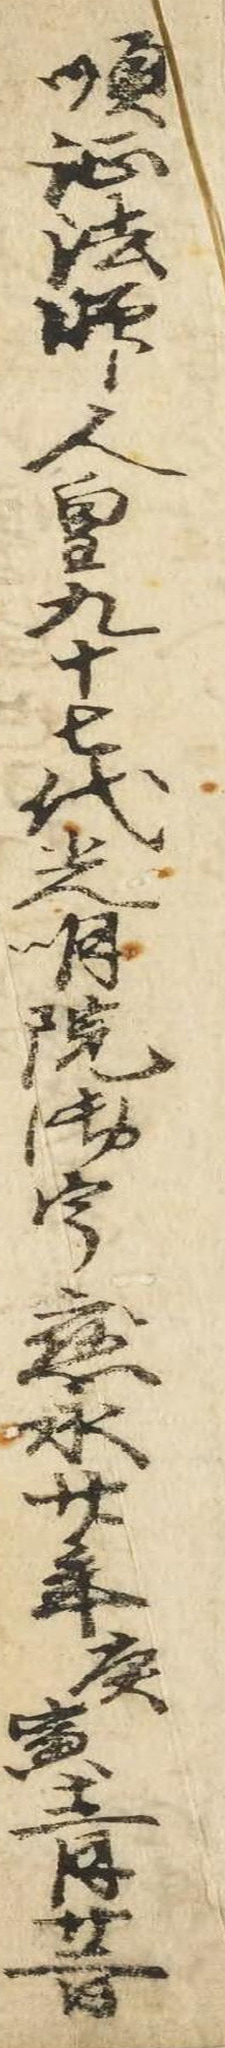順証法師人皇九十七代光明院御宇応永廿年庚寅十二月廿二日
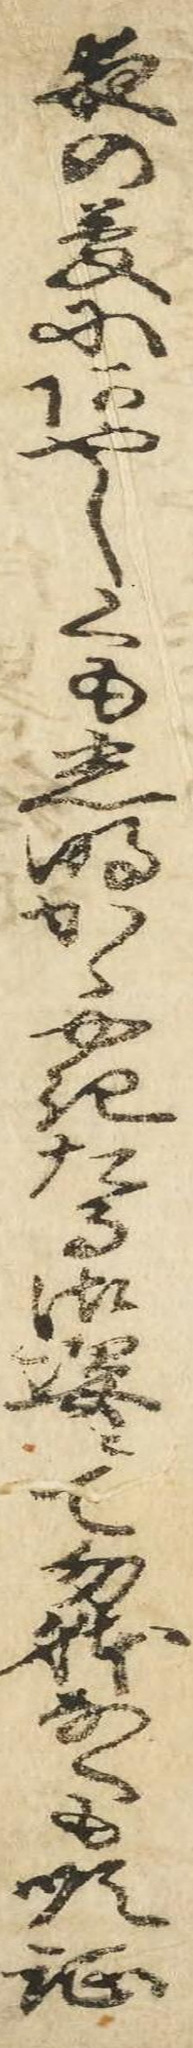夜の夢にあやしくも光明かゝやきたる御姿にて勿体なくも順証
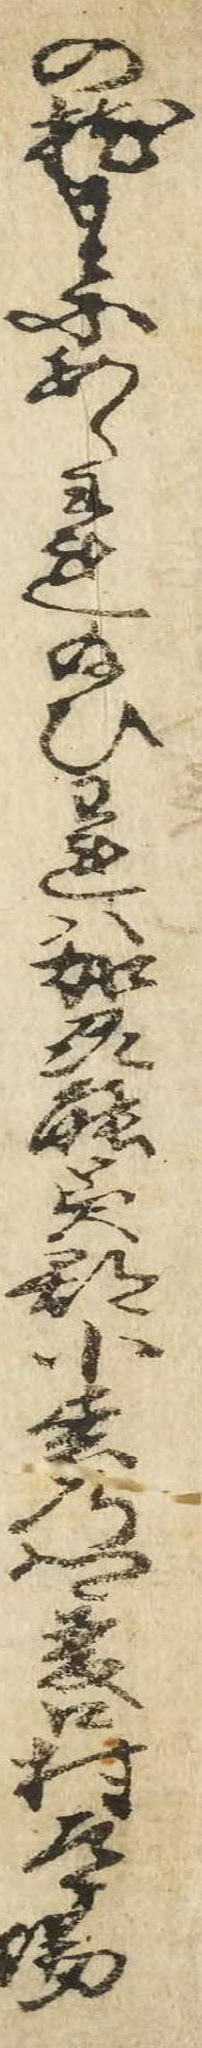の枕もとにあらわれ給ひわれは加州能美郡小松の郷麦口村道場
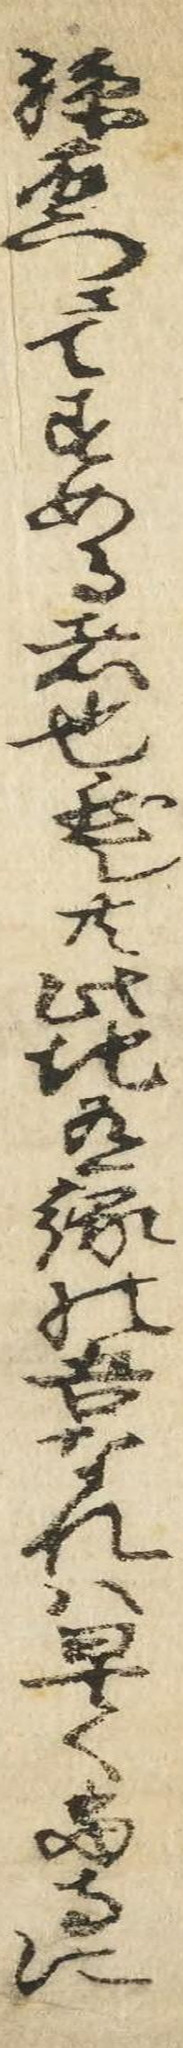孫右衛門にてすめる者也然れ共此地有縁の吾なれは早く当寺に
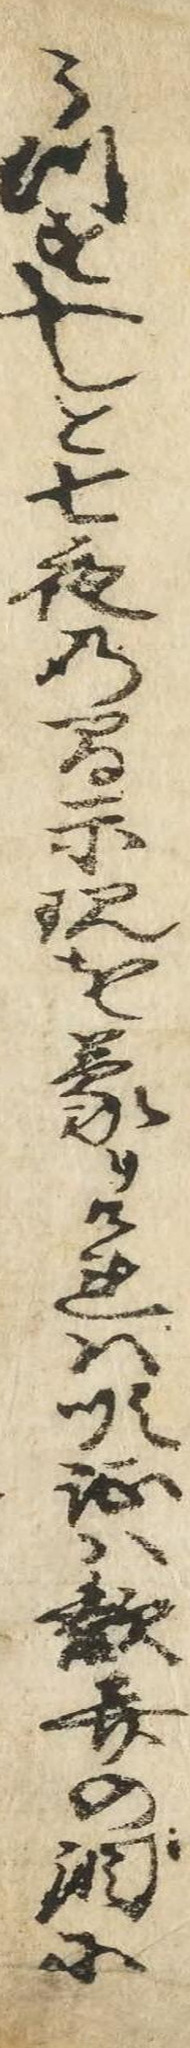うつすへしと七夜の間示現を蒙りけれは順証は歓喜の泪に
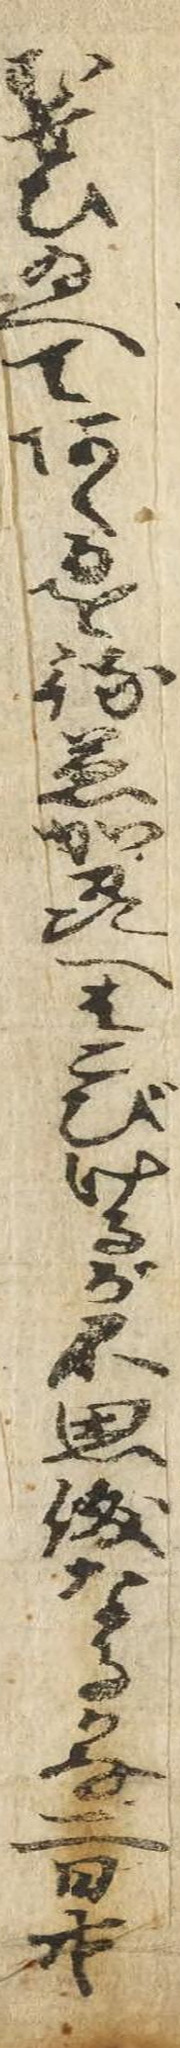むせひ給へてあくるを待兼加州へはこびけるが不思議なるかな二日市
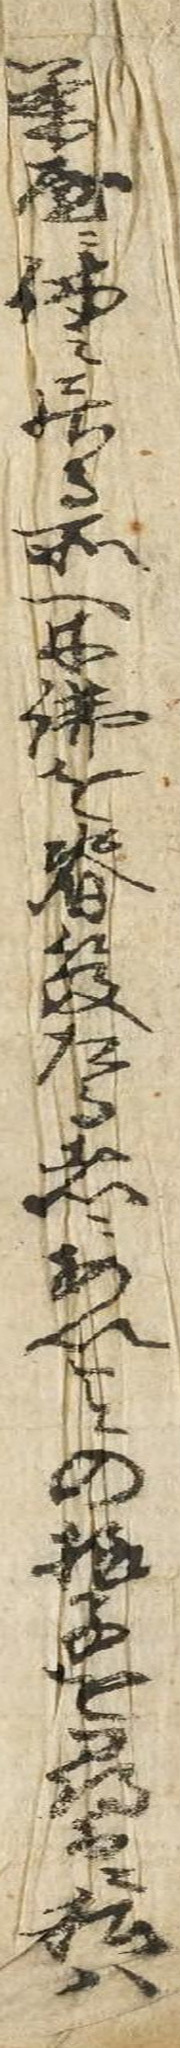茶屋に休み居る所へ木仏を背笈たる者にあいことの様子を尋るに私は
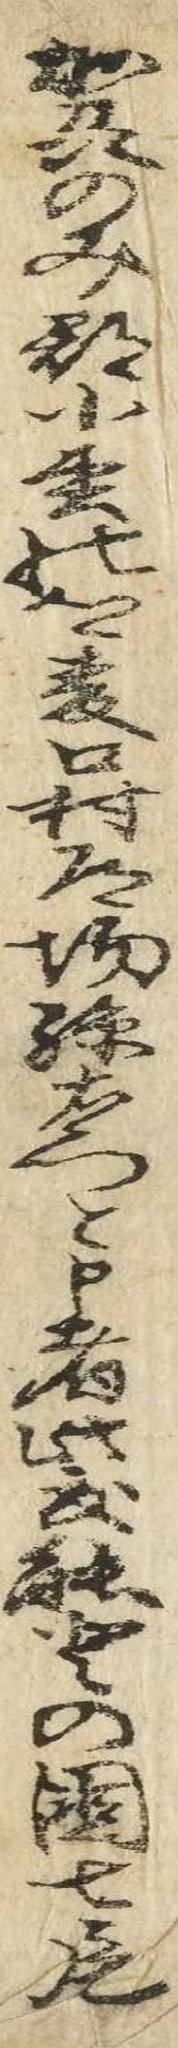加州のみ郡小松の郷麦口村道場孫右衛門と申者此度能登の国七尾
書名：加能真宗聖集
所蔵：Ishikawa Prefectural Library
